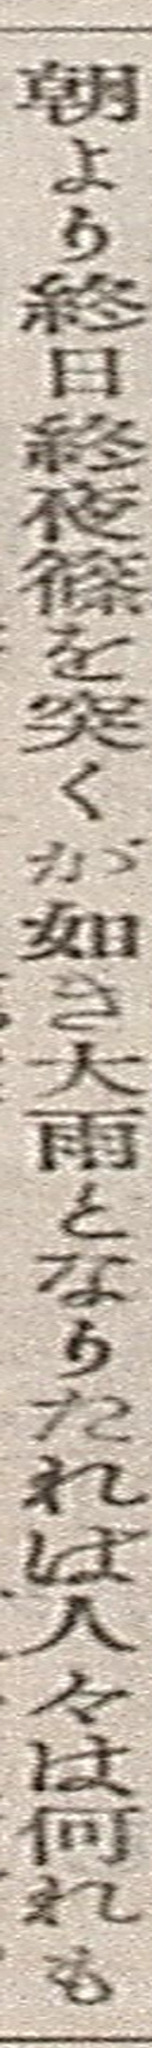朝より終日終夜篠を突くが如き大雨となりたれば人々は何れも
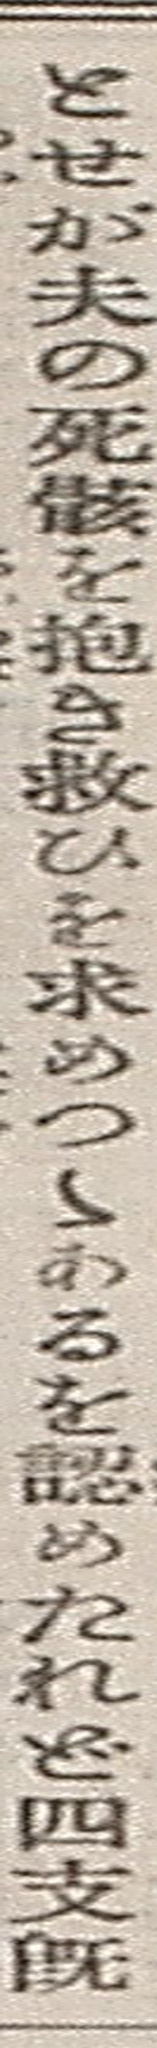とせが夫の死骸を抱き救ひを求めつゝあるを認めたれど四支既
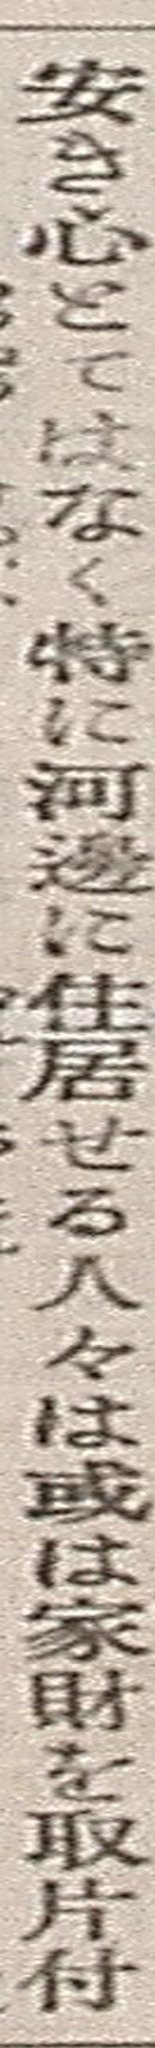安き心とてはなく特に河辺に住居せる人々は或は家財を取片付
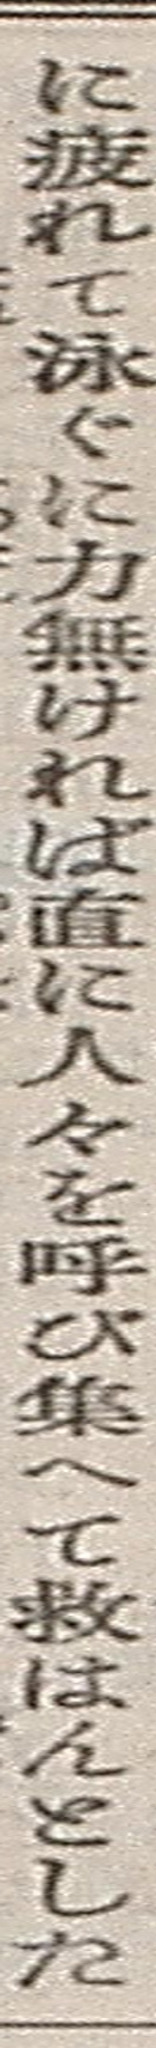に疲れて泳ぐに力無ければ直に人々を呼び集へて救はんとした
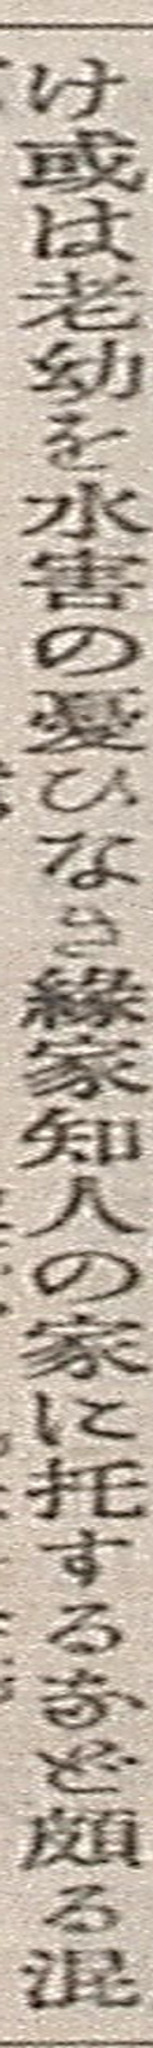け或は老幼を水害の憂ひなき縁家知人の家に托するなど頗る混
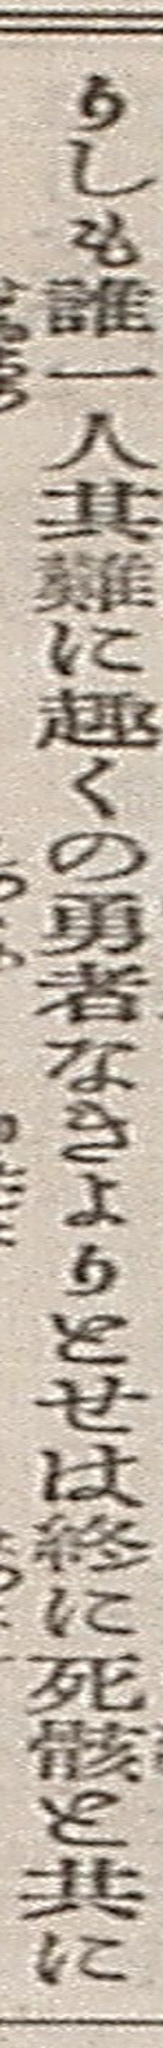りしも誰一人其難に趣くの勇者なきよりとせは終に死骸と共に
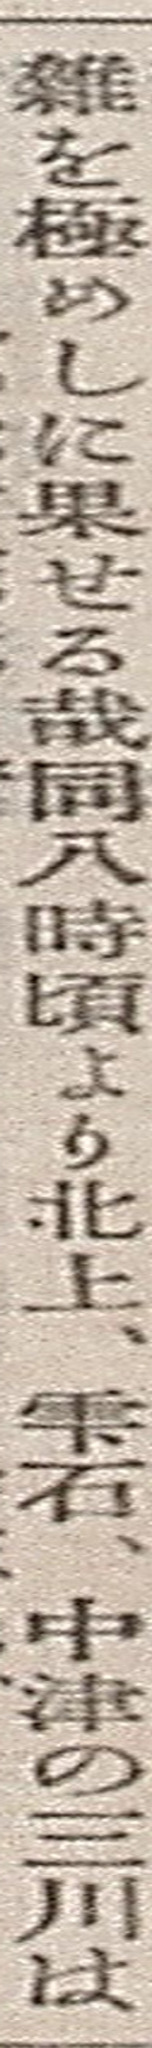雑を極めしに果せる哉同八時頃より北上、雫石、中津の三川は
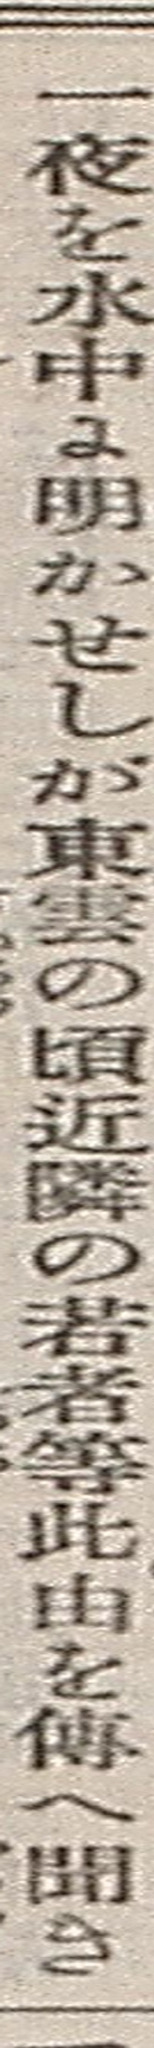一夜を水中に明かせしが東雲の頃近隣の若者等此由を伝へ聞き
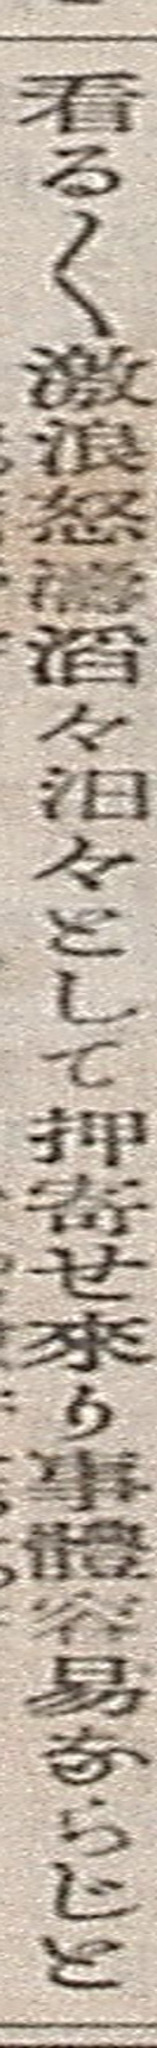看る〳〵激浪怒濤滔々汨々として押寄せ来り事体容易ならじと
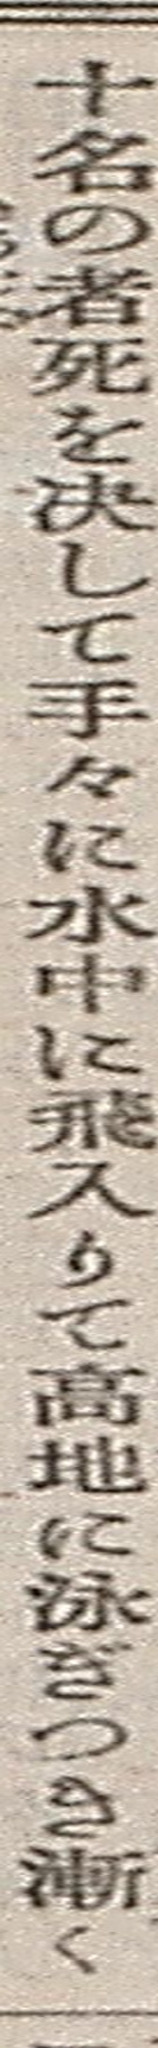十名の者死を决して手々に水中に飛入りて高地に泳ぎつき漸く
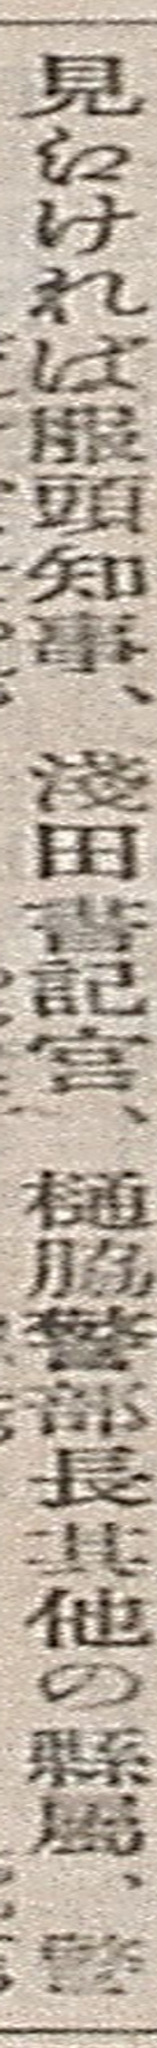見えければ服部知事、浅田書記官、樋脇警部長其他の県庁、警
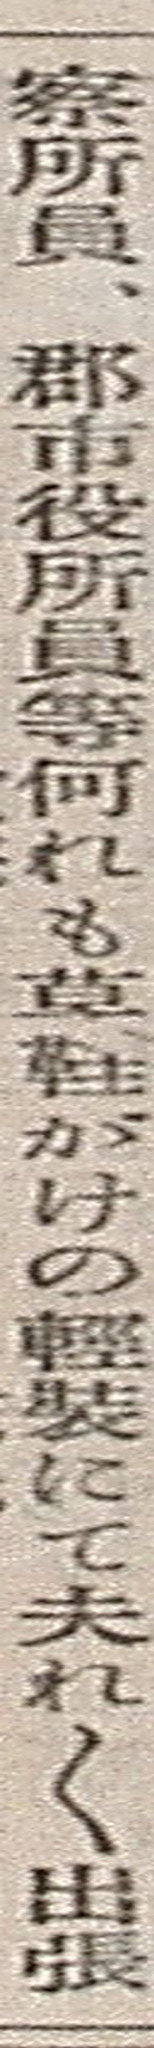察所員、郡市役所員等何れも草鞋がけの軽装にて夫れ〳〵出張
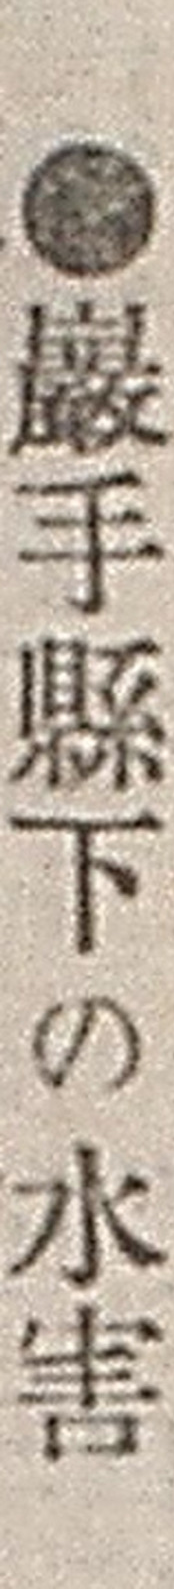●巌手県下の水害
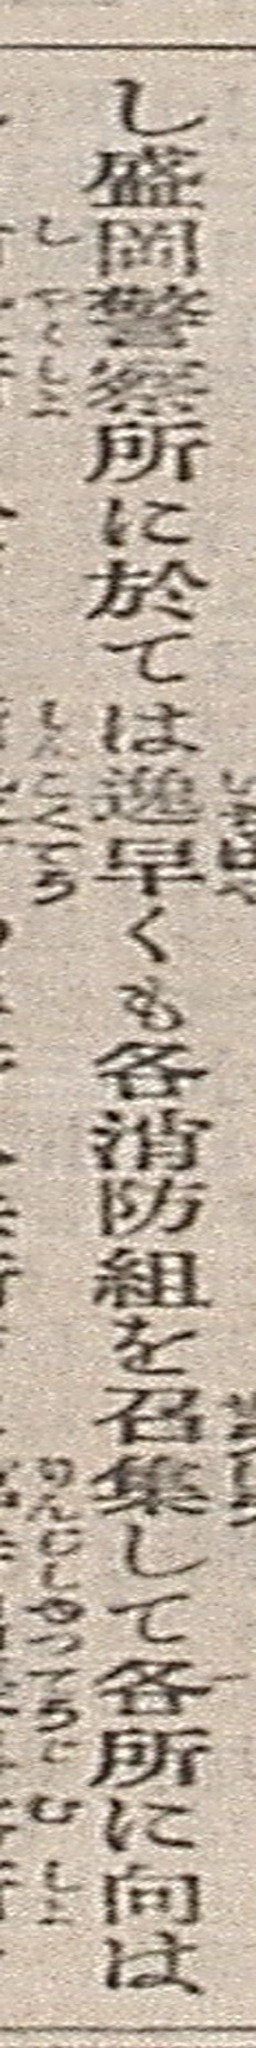し盛岡警察所に於ては逸早くも各消防組を招集して各所に向は
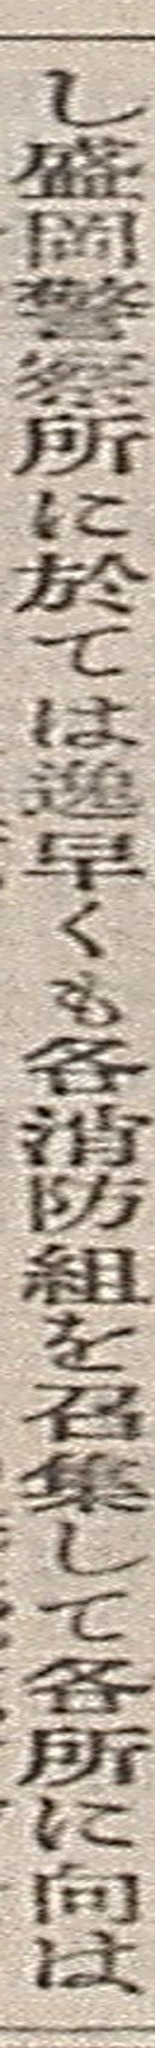し盛岡警察所に於ては逸早くも各消防組を招集して各所に向は
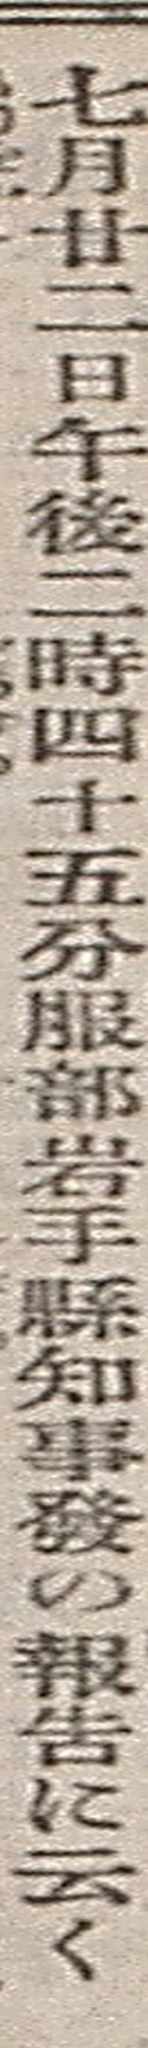七月廿二日午後二時四十五分服部岩手県知事発の報告に云く
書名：風俗畫報臨時増刊第百二十八號　洪水被害録（下）
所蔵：東京大学地震研究所図書室 Earthquake Research Institute Library, The University of Tokyo, JAPAN
